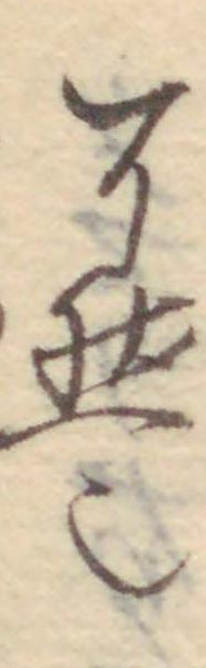可然也
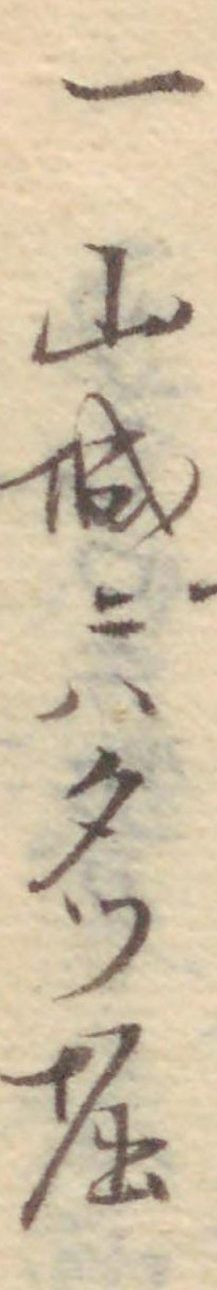一山城ニハタツ堀
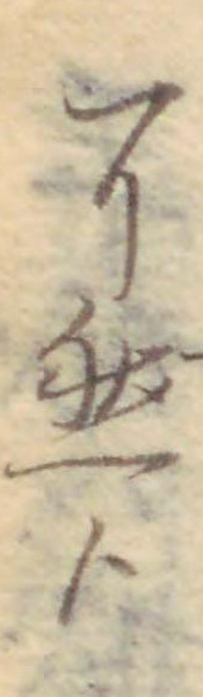可然候

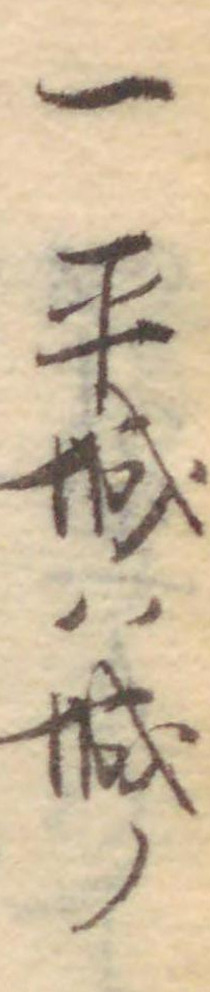一平城ハ城ノ
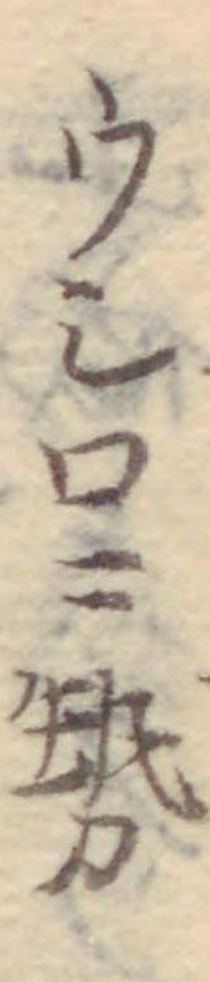ウシロニ勢
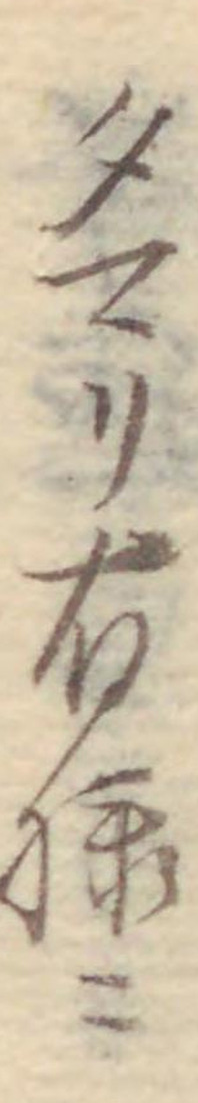タマリ有様ニ
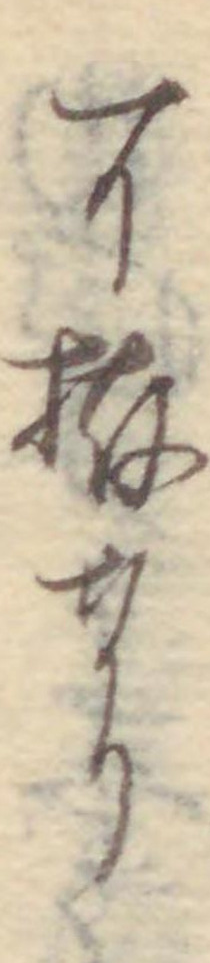可拵なり
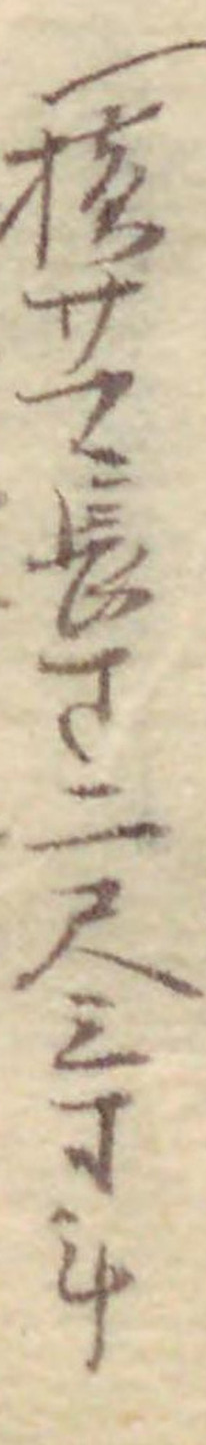横サマ長さ二尺三寸斗
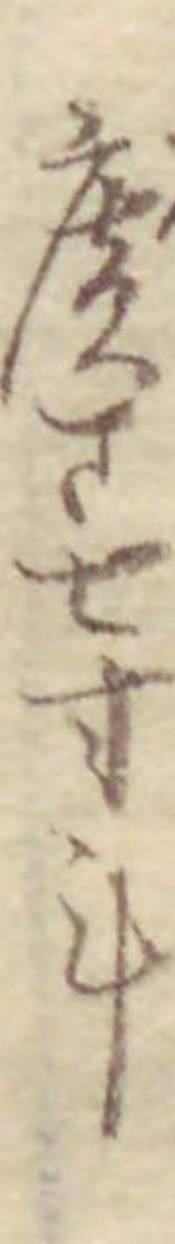広さ七寸斗
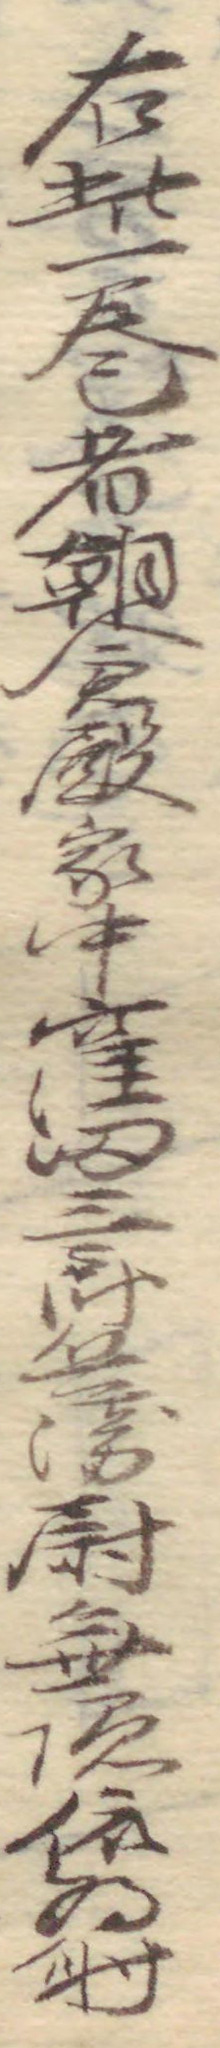右此一巻者朝倉殿家中窪田三郎兵衛尉無隠依為射
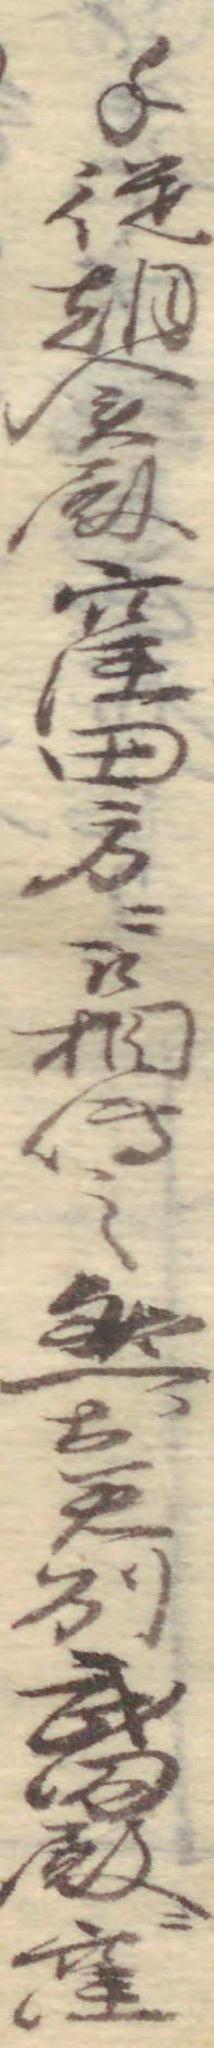手従朝倉殿窪田方ニ被相伝之然於若州武田殿ニ窪
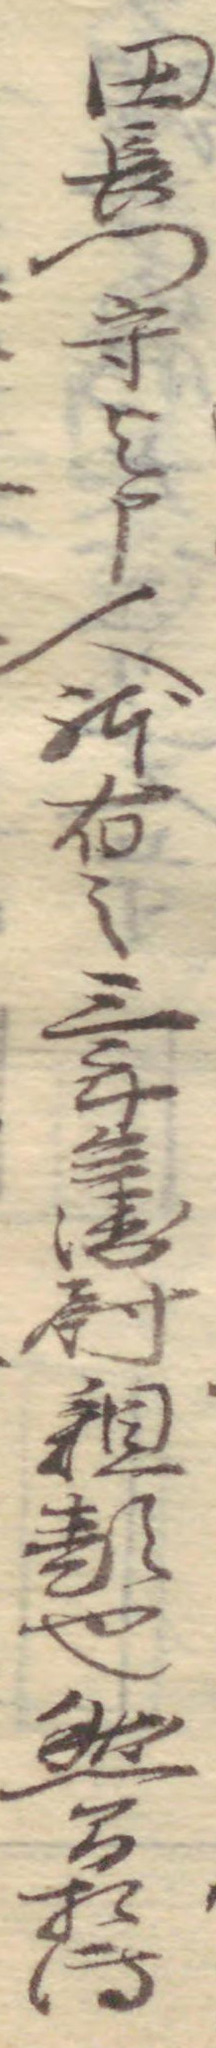田長門守と申人体有之三郎兵衛尉親類也然間相伝
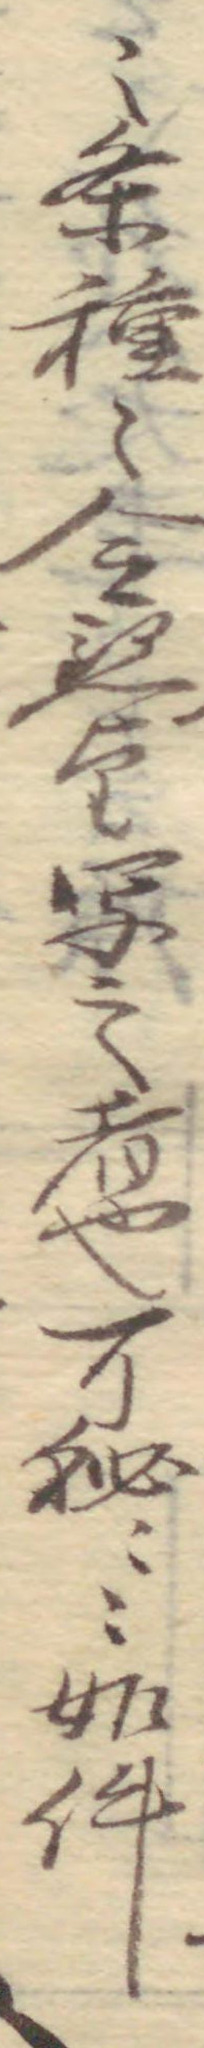之条種々令懇望写之者也可秘々々如件
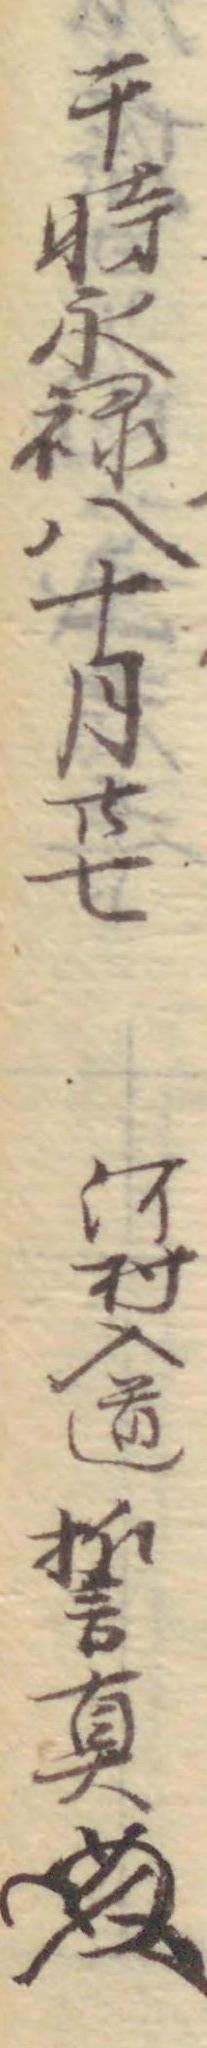于時永禄八十月廿七河村入道誓真花押
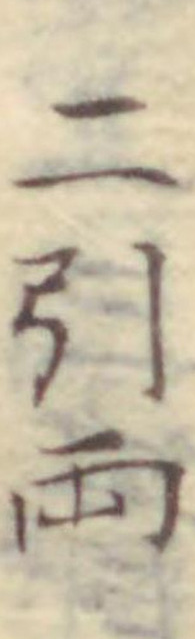二引両
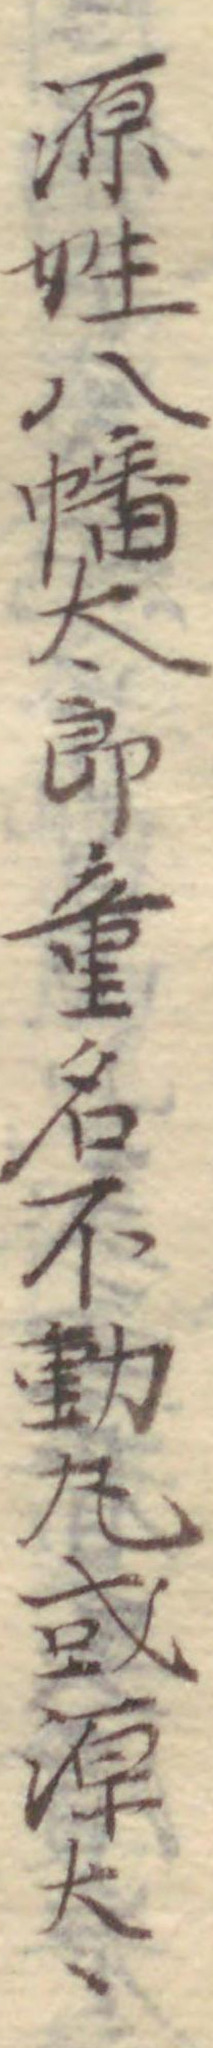源姓八幡太郎童名不動丸或源太
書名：鶯宿雑記. 巻199-200
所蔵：国立国会図書館 National Diet Library, JAPAN
